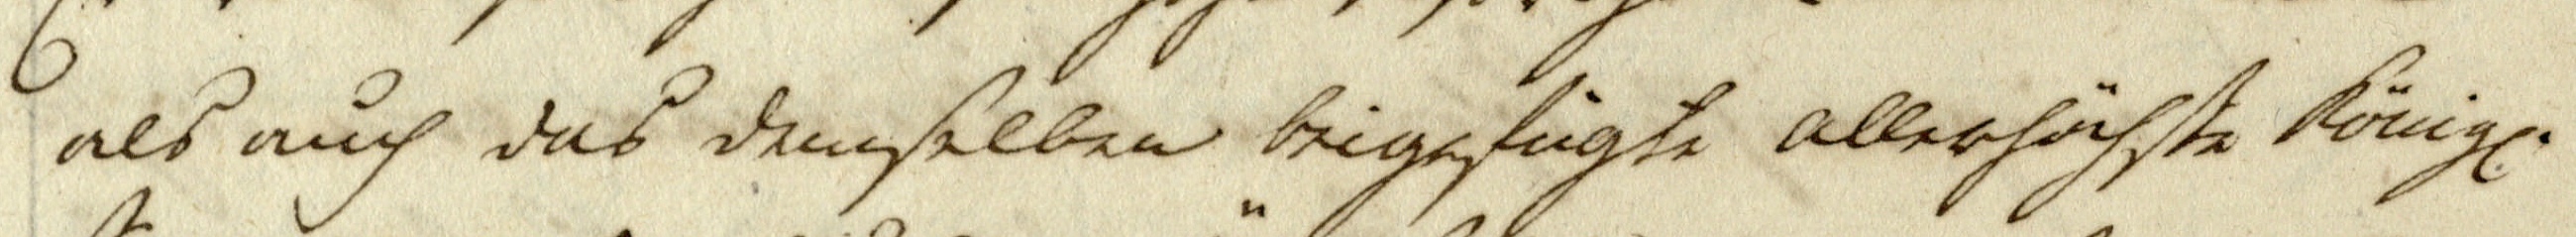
als auch das demselben beigefügte allerhöchste Königl.
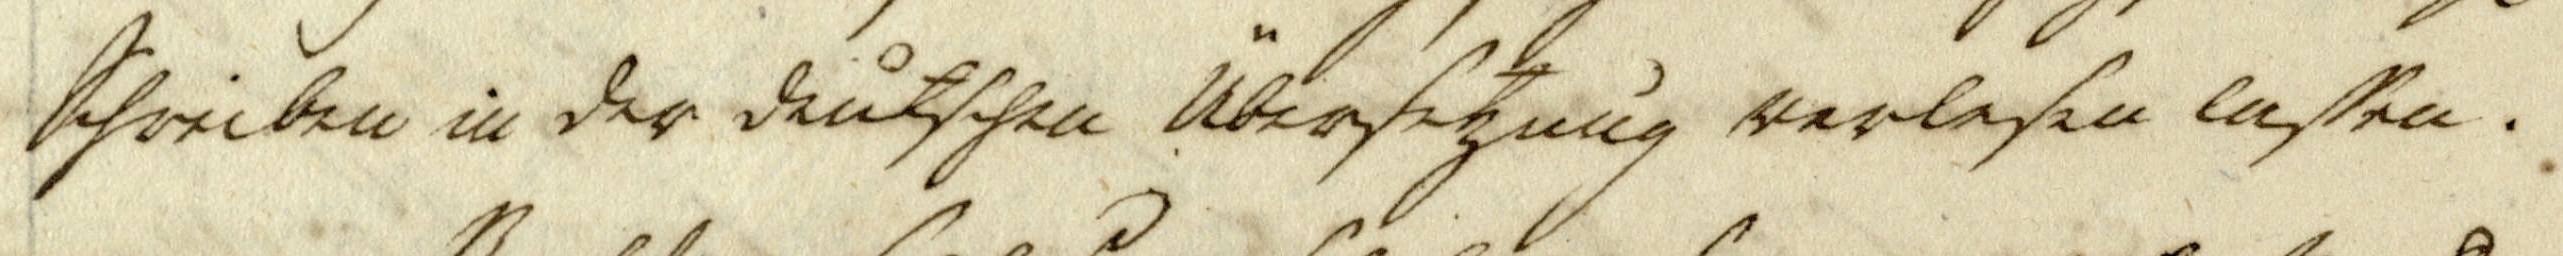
Schreiben in der deutschen Übersetzung verlesen lassen.
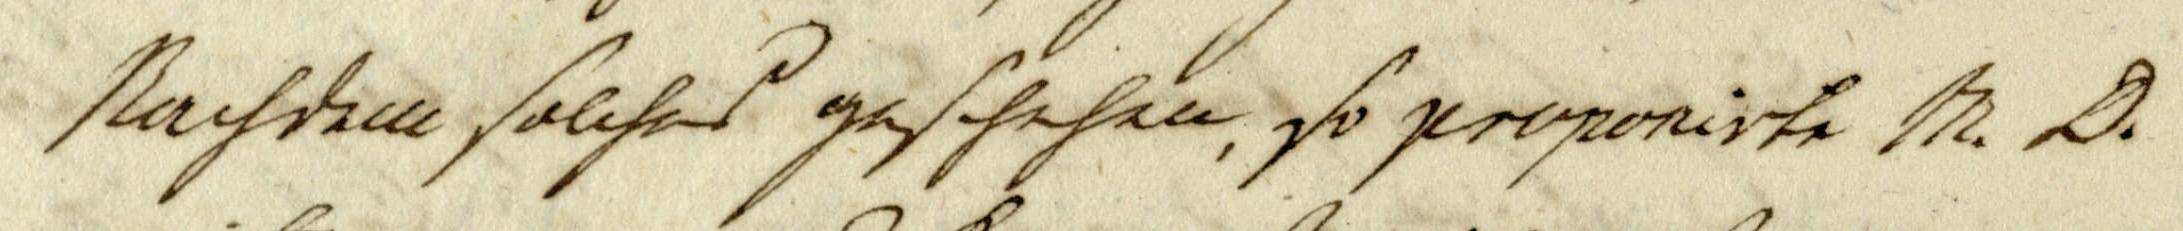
Nachdem solches geschehen, so proponirte M. D.
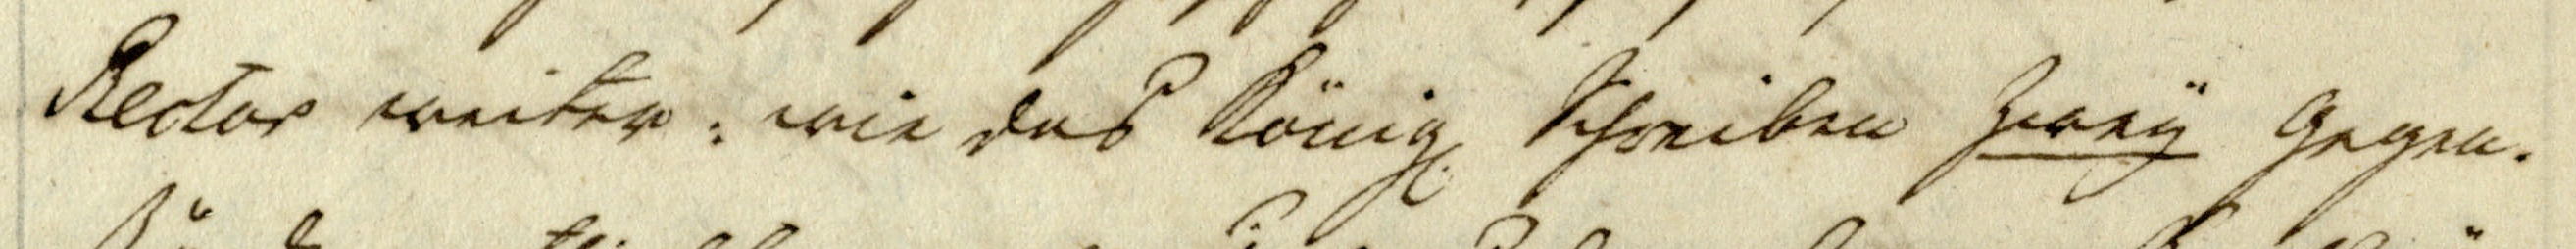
Rector weiter: wie das Königl. Schreiben Zweÿ Gegen¬
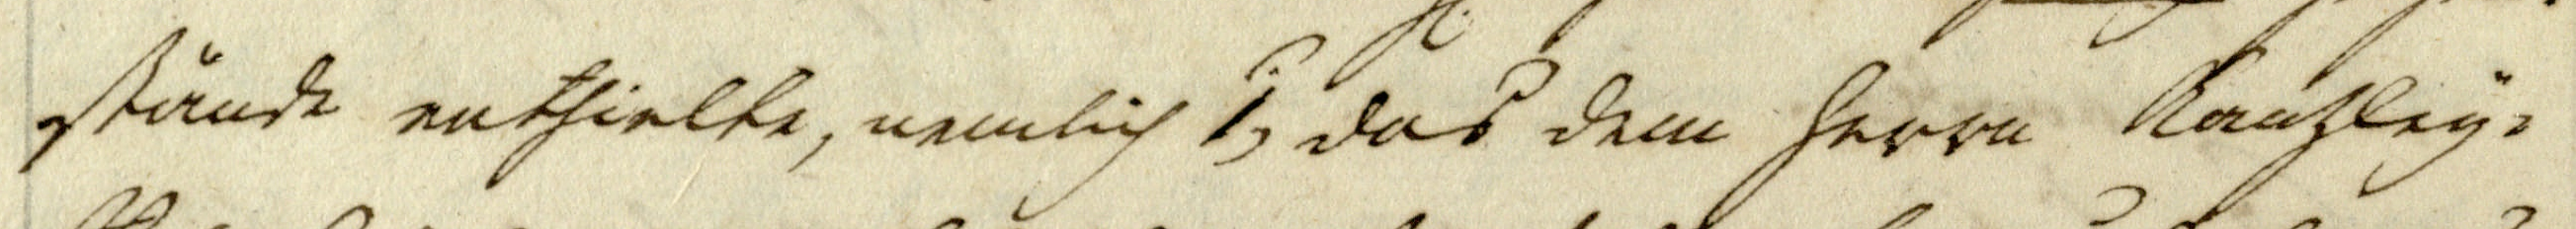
stände enthielte, nemlich 1., das dem herrn Kanzleÿ
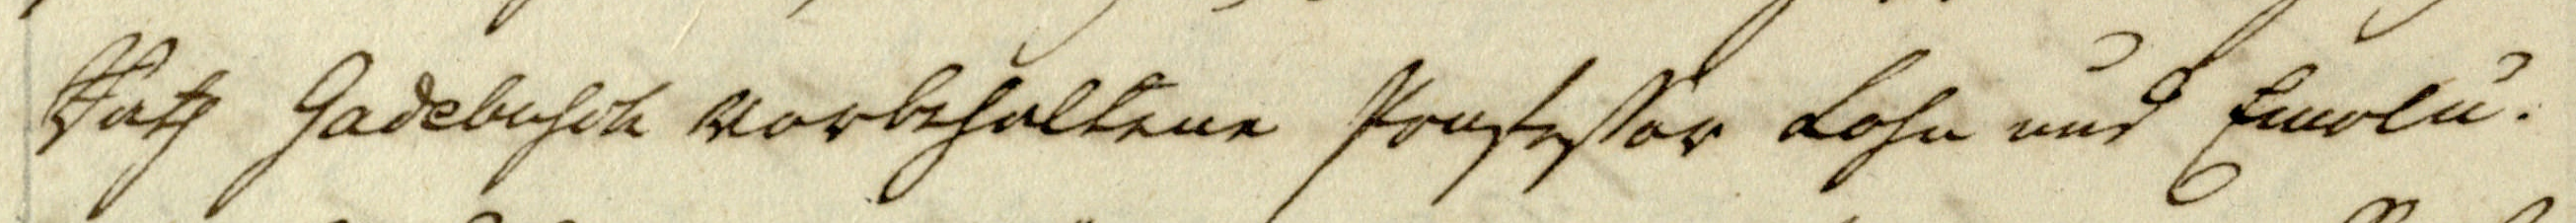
Rath Gadebusch vorbehaltene Professor Lohn und Emolu¬
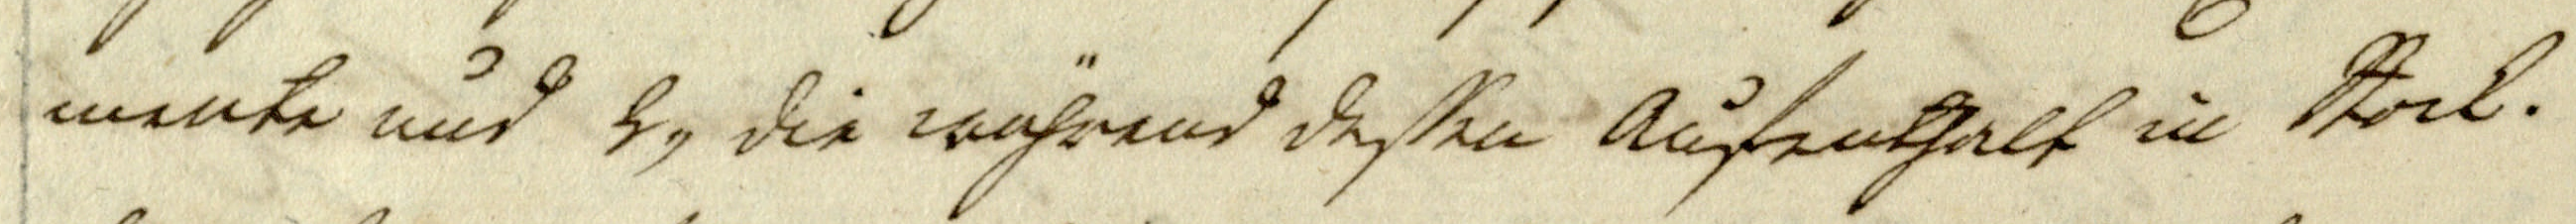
mente und 2., die während dessen Aufenthalt in Stock¬
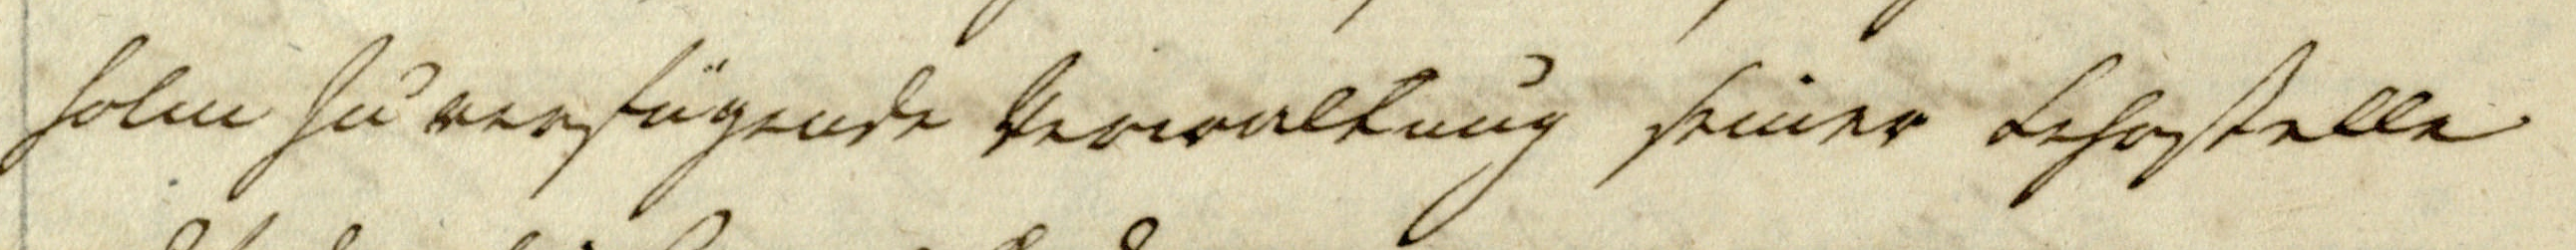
holm zu verfügende Verwaltung seiner Lehrstelle
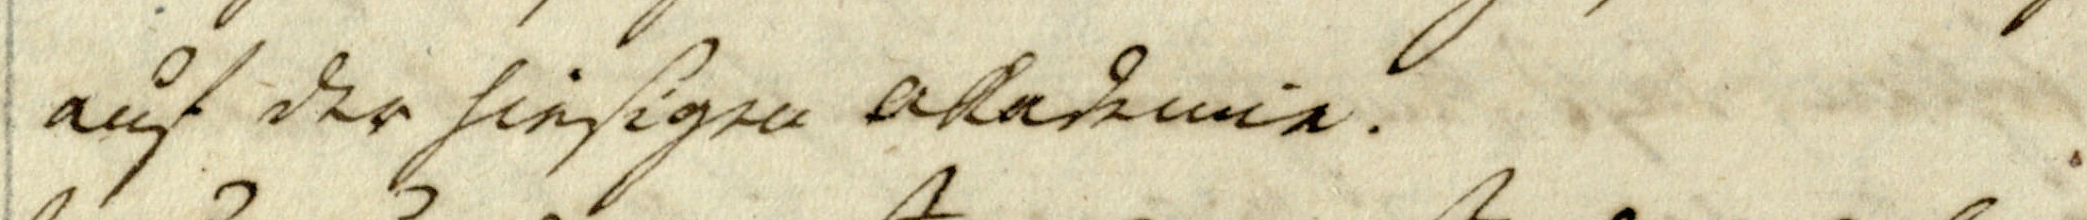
auf der hiesigen Akademie.
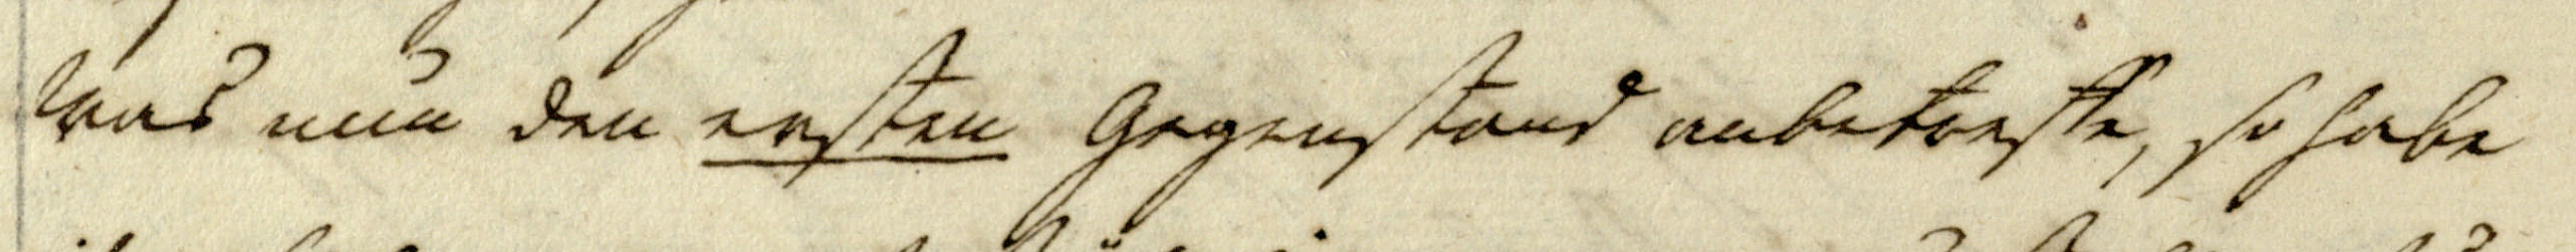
Was nun den ersten Gegenstand anbetreffe, so habe
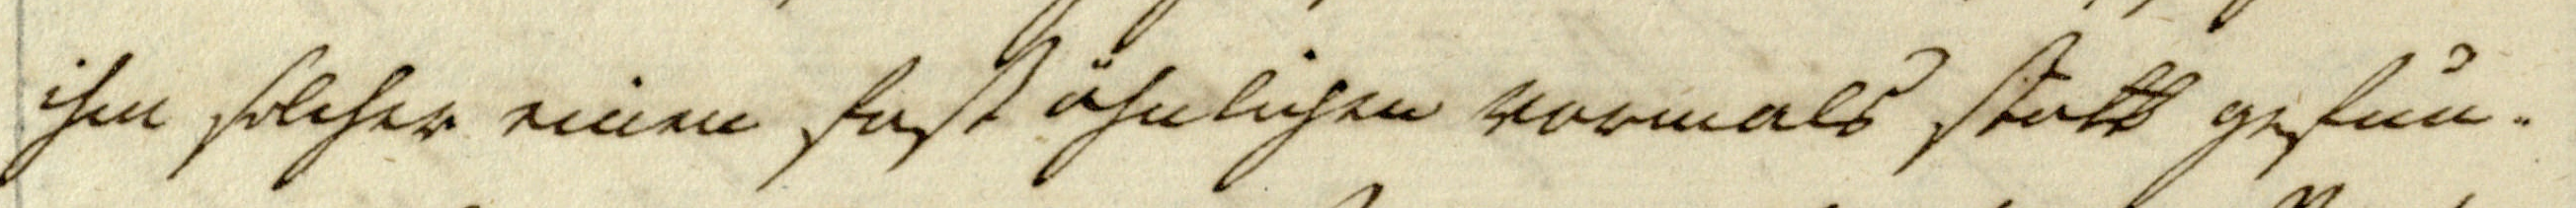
ihm solcher einen fast ähnlichen vormals statt gefun¬
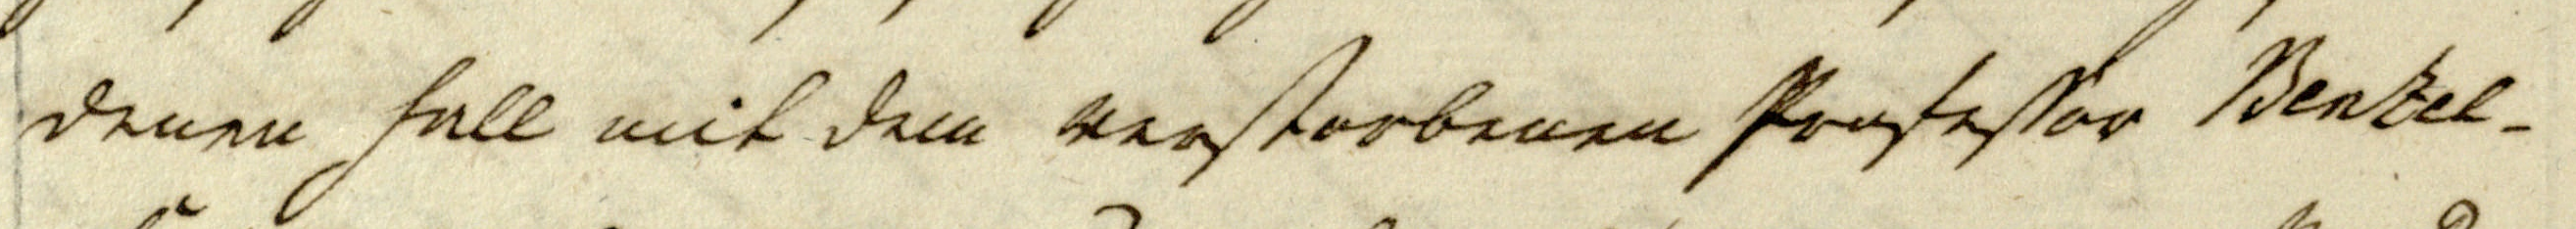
denen Fall mit dem verstorbenen Professor Benzel¬
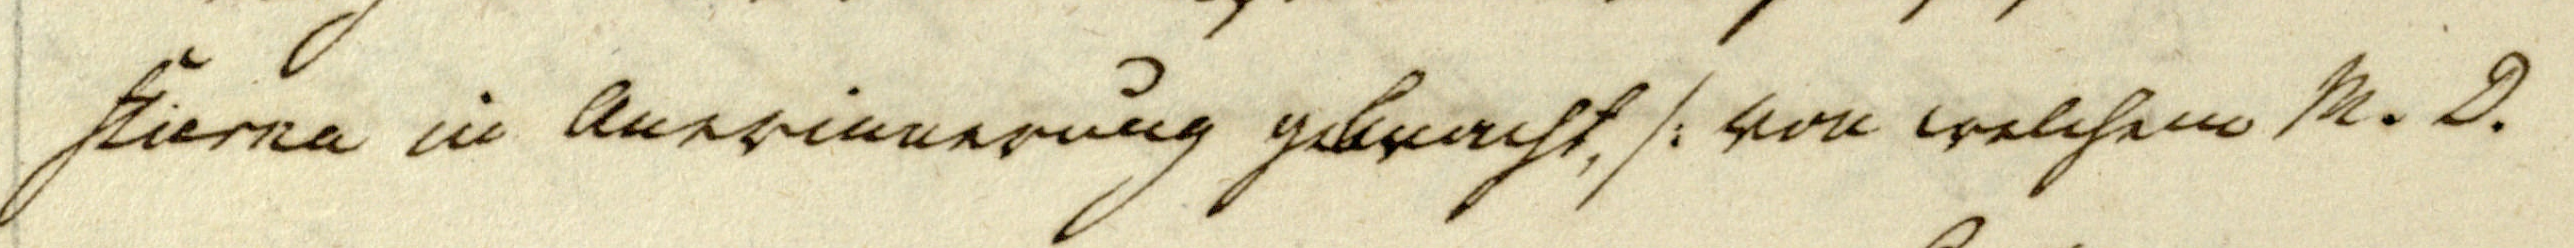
stierna in Anerinnerung gebracht, / von welchem M. D.
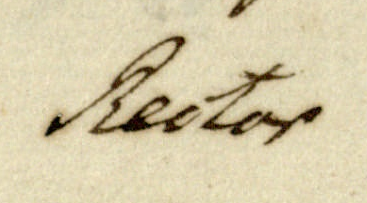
Rector
